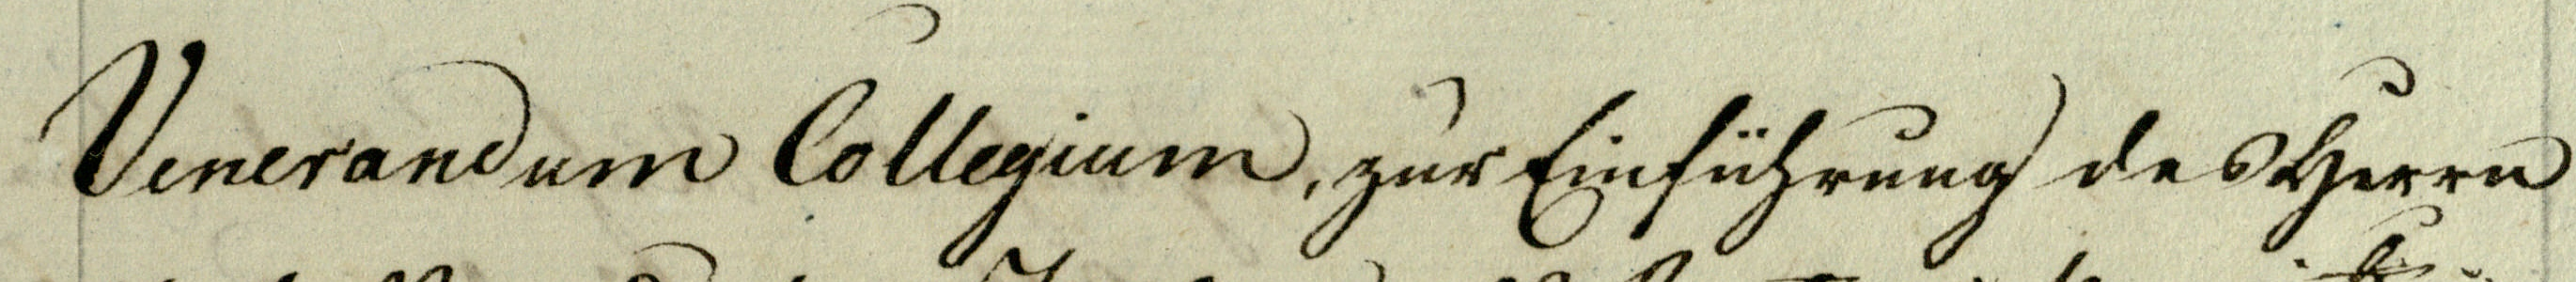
Venerandum Collegium, zur Einführung des Herrn
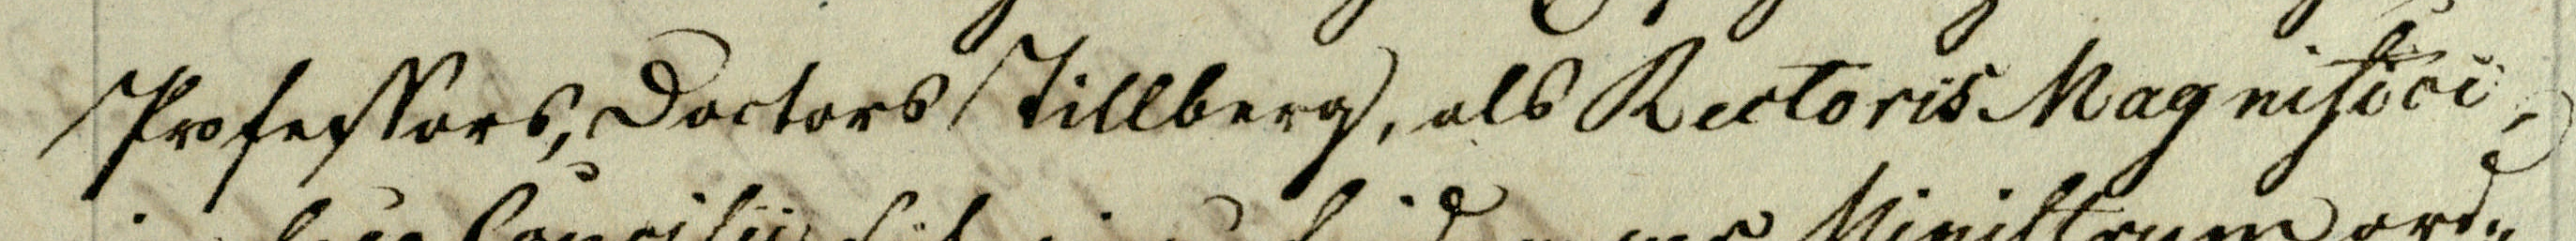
Professors, Doctors Tillberg, als Rectoris Magnifici
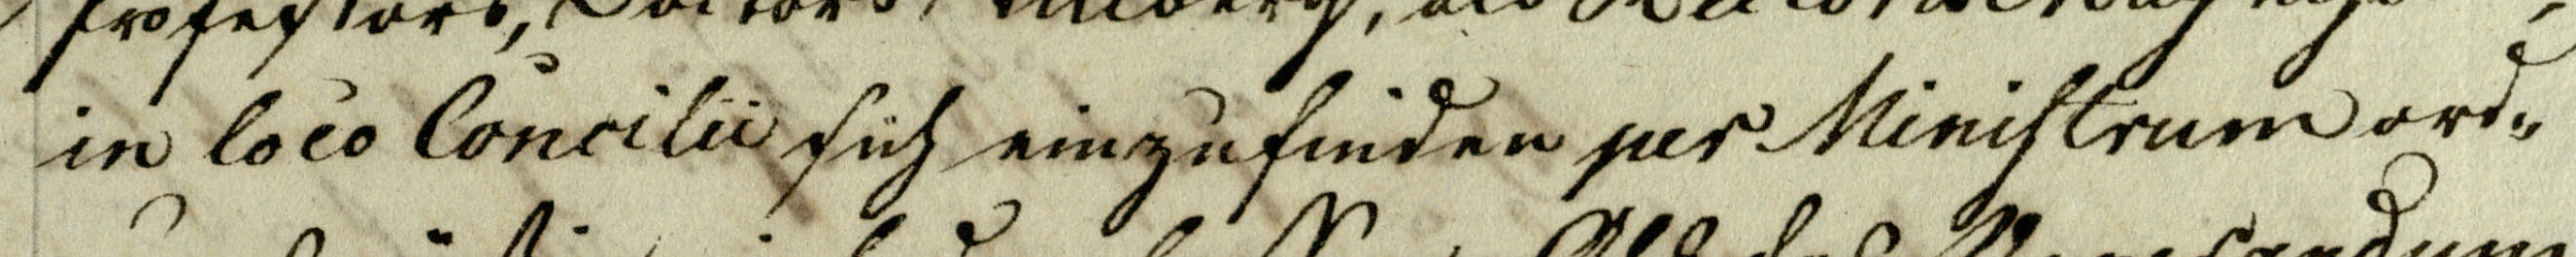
in loco Concilii sich einzufinden per Ministrum ord¬
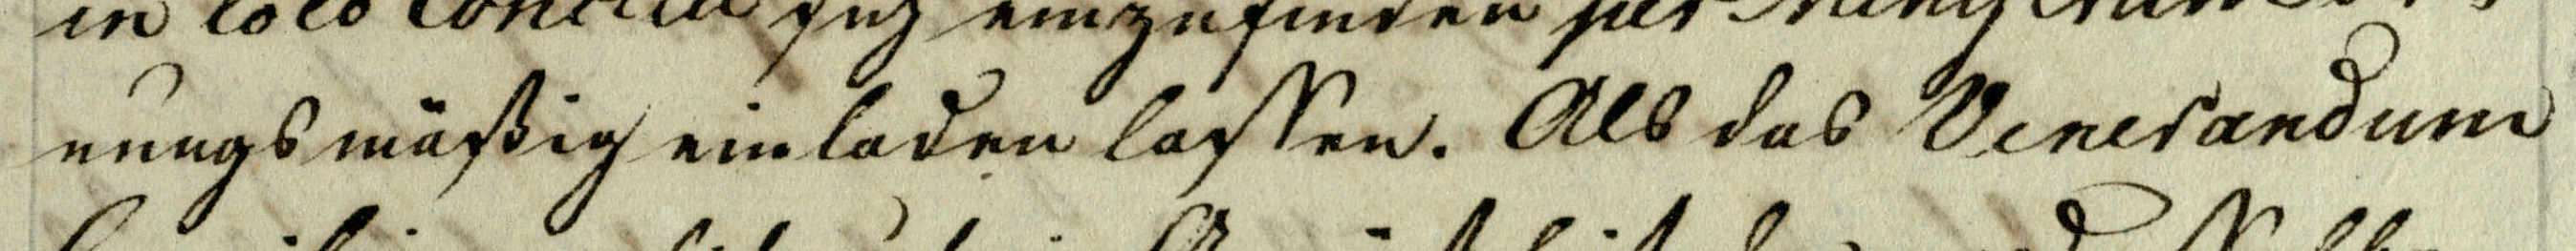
nungsmäßig einladen lassen. Als das Venerandum
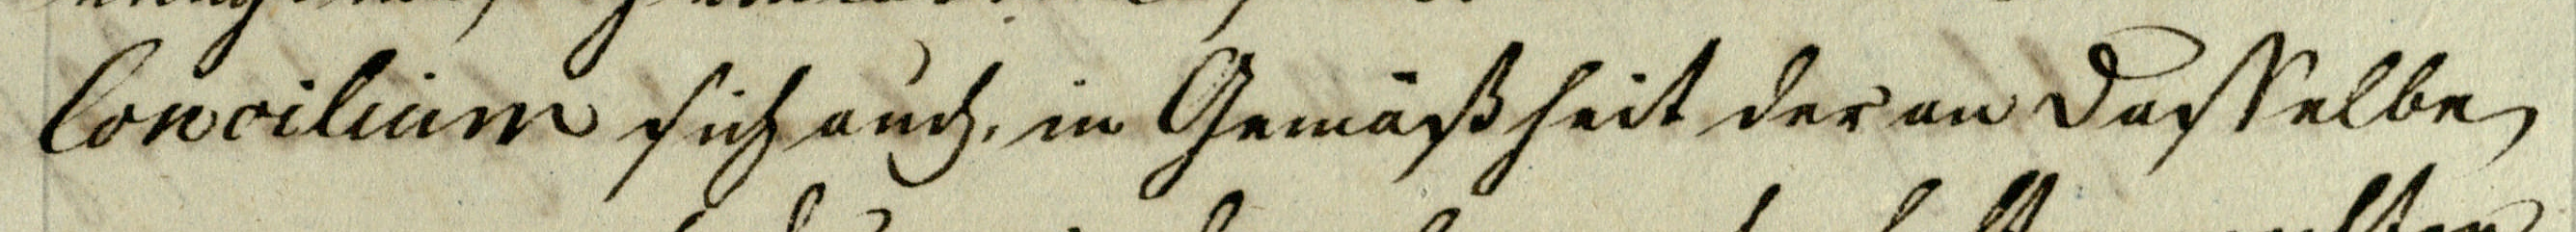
Concilium sich auch, in Gemäsheit der an dasselbe
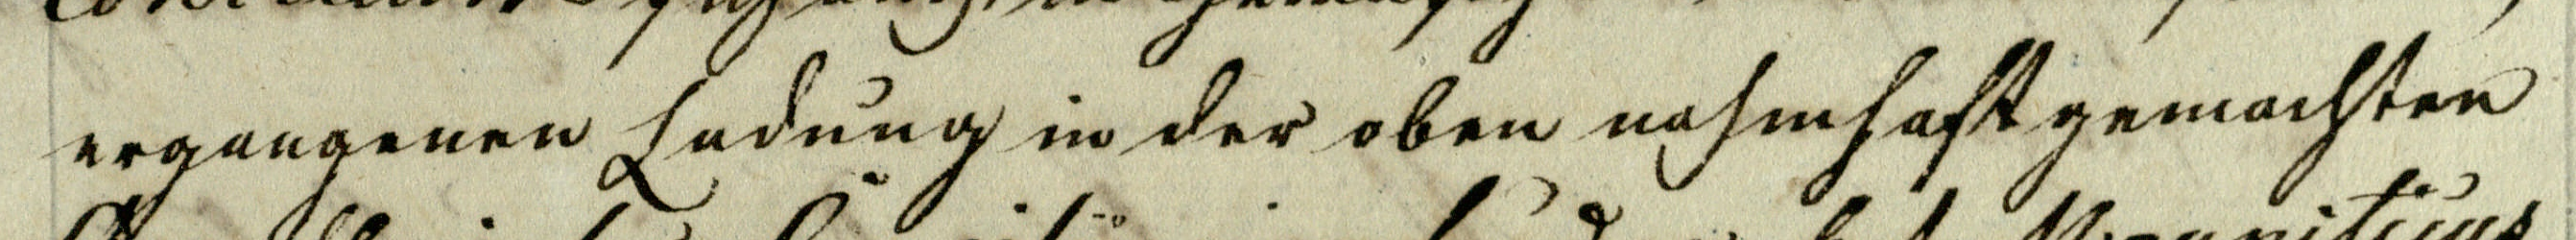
ergangenen Ladung in der oben nahmhaft gemachten
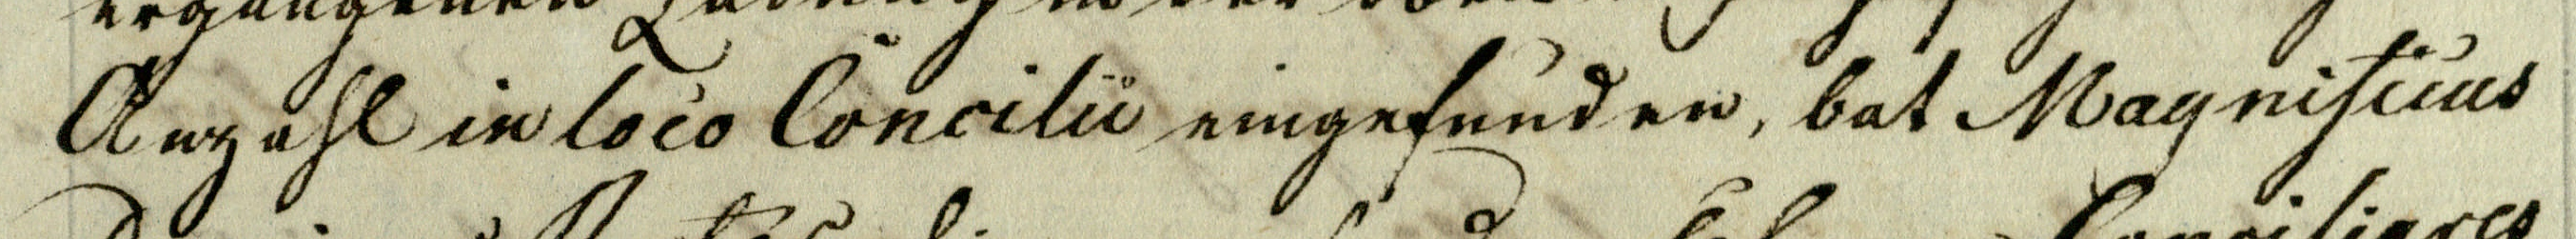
Anzahl in loco Concilii eingefunden, bat Magnificus
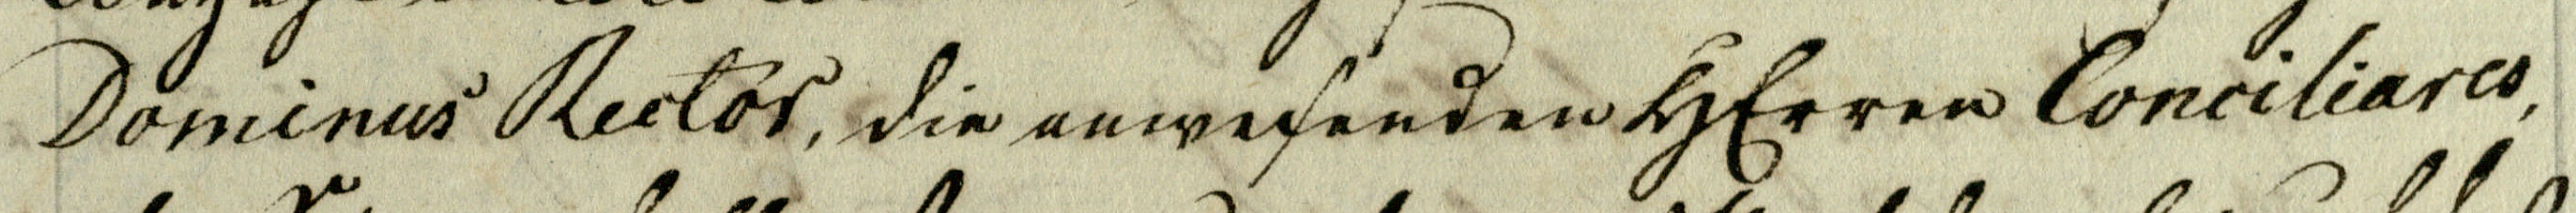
Dominus Rector, die anwesenden Herren Conciliares,
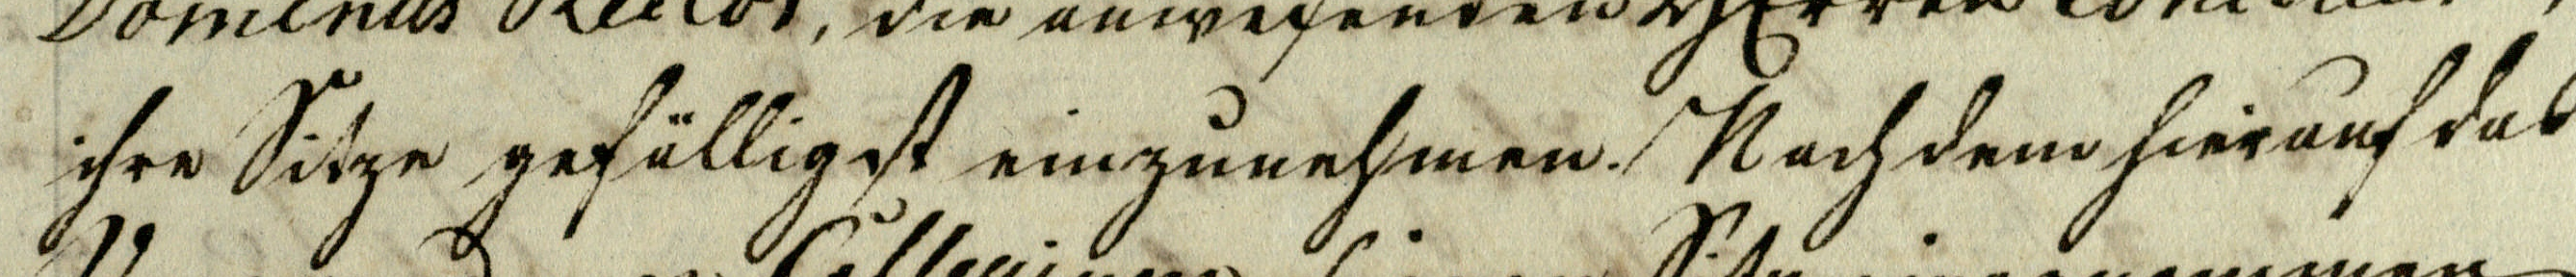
ihre Sitze gefälligst einzunehmen. Nach dem hierauf das
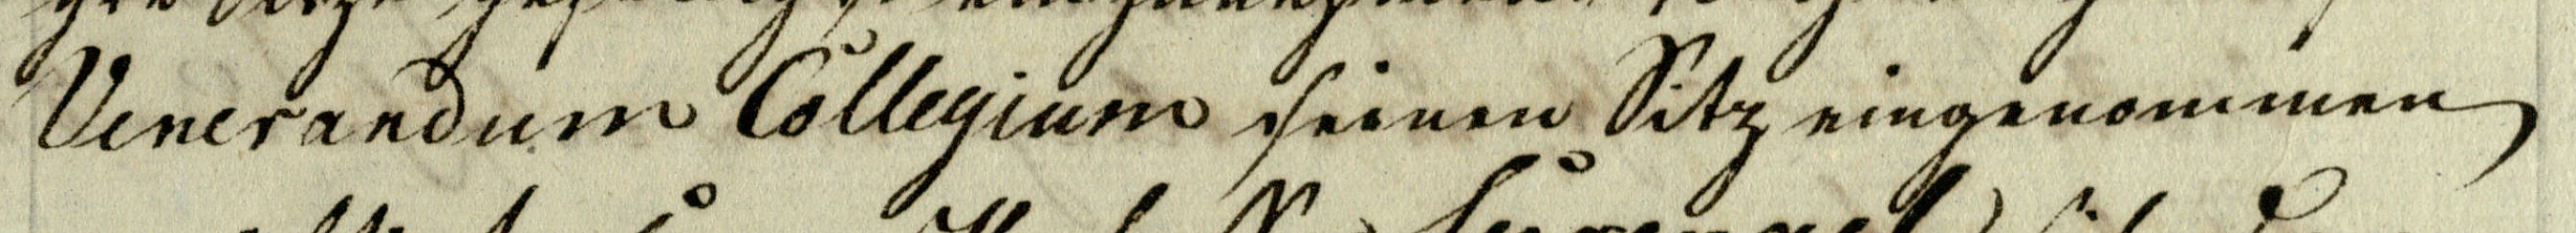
Venerandum Collegium seinem Sitz eingenommen
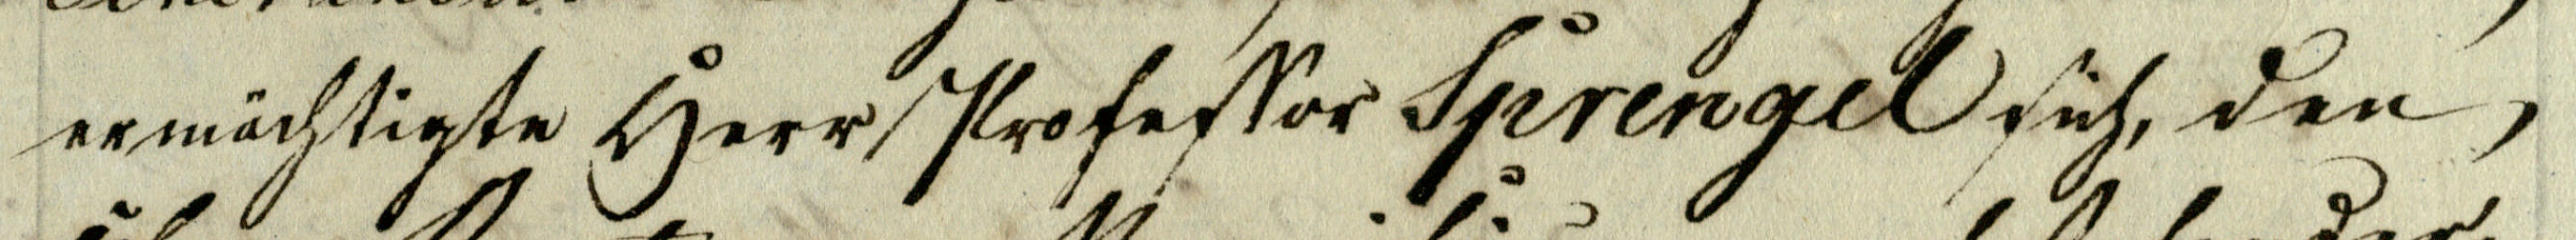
ermächtigte Herr Professor Sprengel sich, den
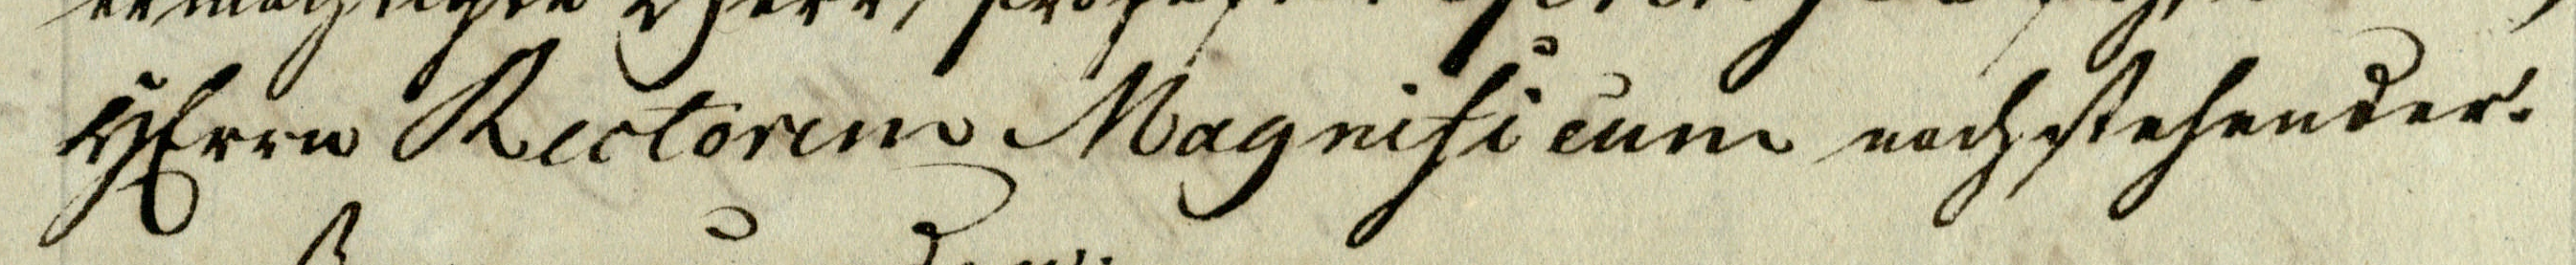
Herrn Rectorem Magnificum nachstehender¬
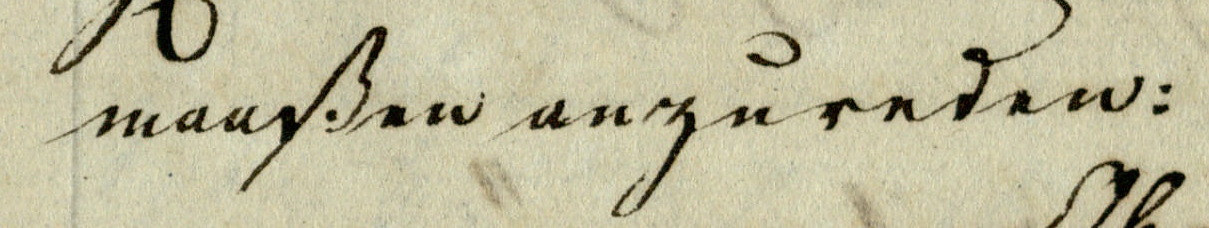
massen anzureden:
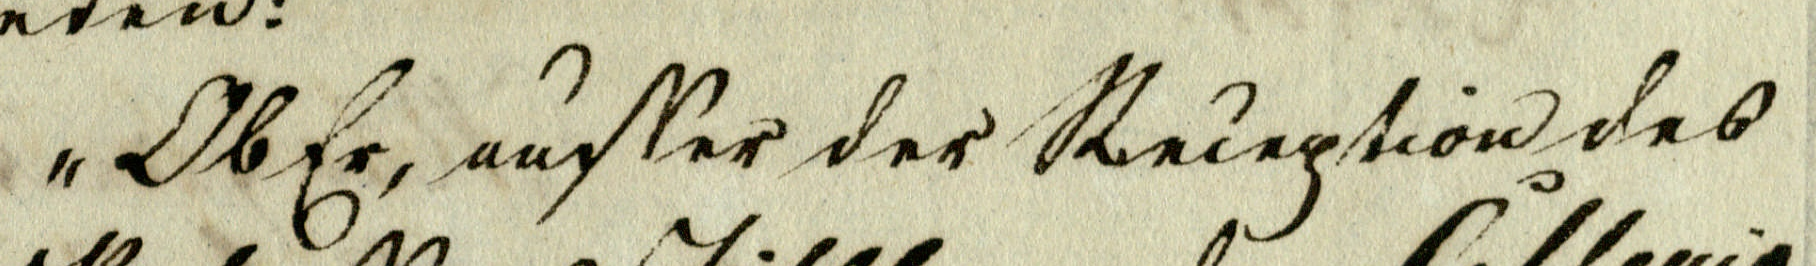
"Ob Er, ausser der Reception des
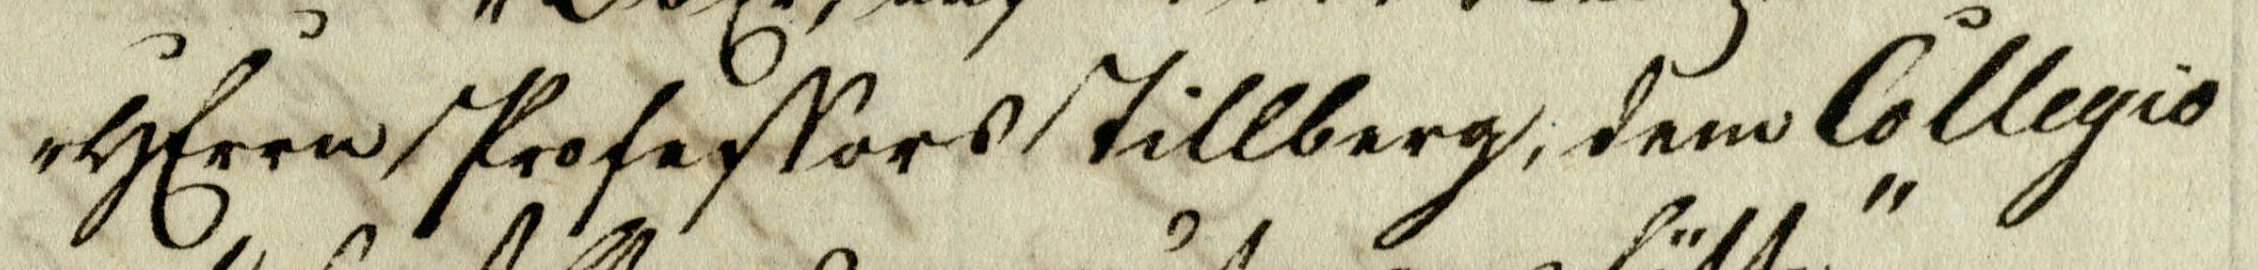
Herrn Professors Tillberg, dem Collegio
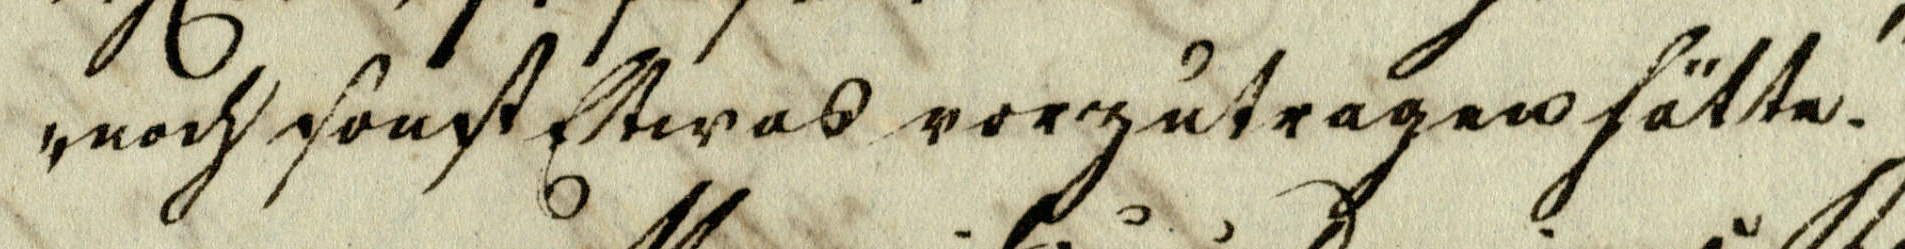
noch sonst etwas vorzutragen hätte."
